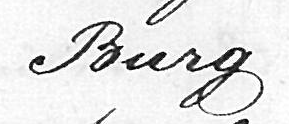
Burg
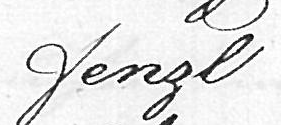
Fenzl
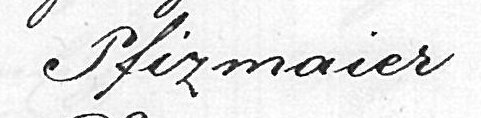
Pfizmaier
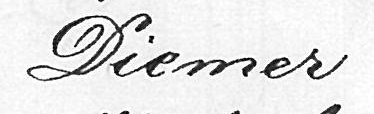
Diemer
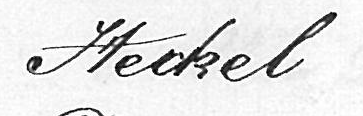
Heckel
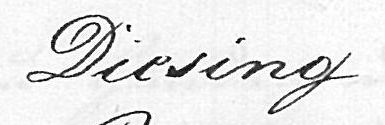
Diesing
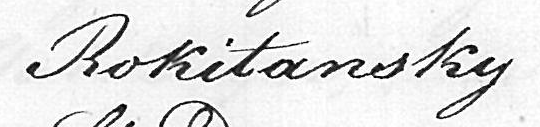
Rokitansky
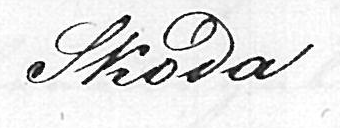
Skoda
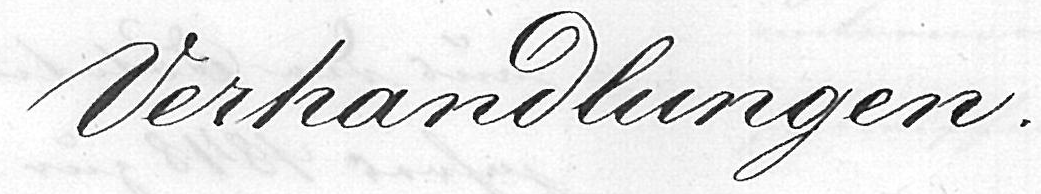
Verhandlungen.
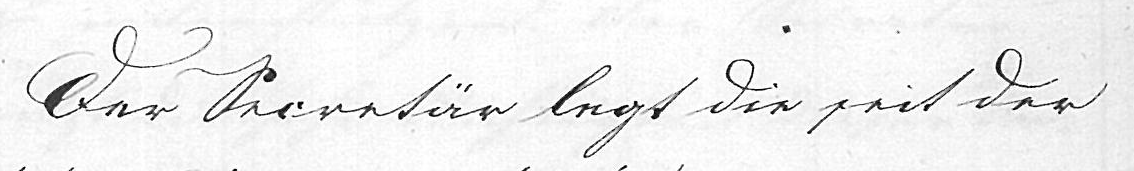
Der Secretär legt die seit der
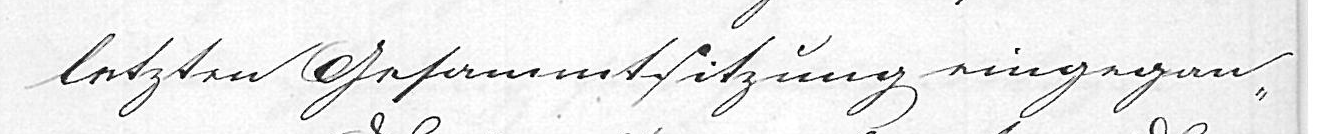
letzten Gesammtsitzung eingegan-
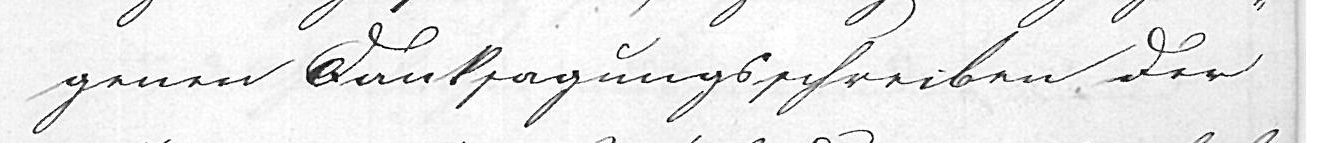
genen Danksagungsschreiben der
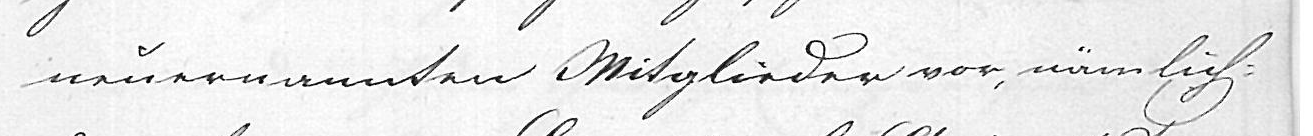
neuernannten Mitglieder vor, nämlich
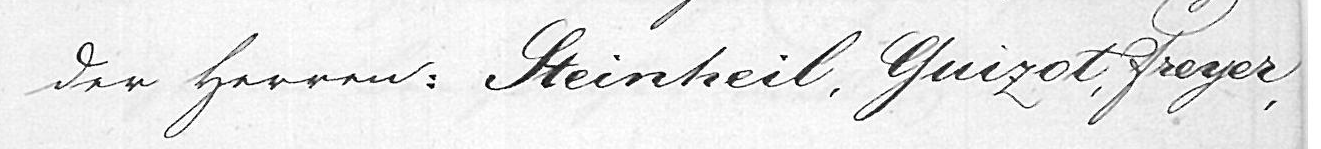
der Herren: Steinheil, Guizot, Freyer,
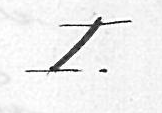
I.
